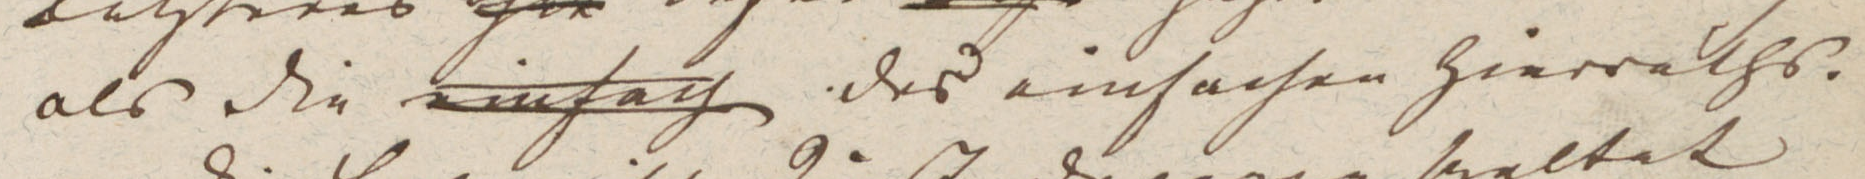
als die einfach des einfachen Zierraths.
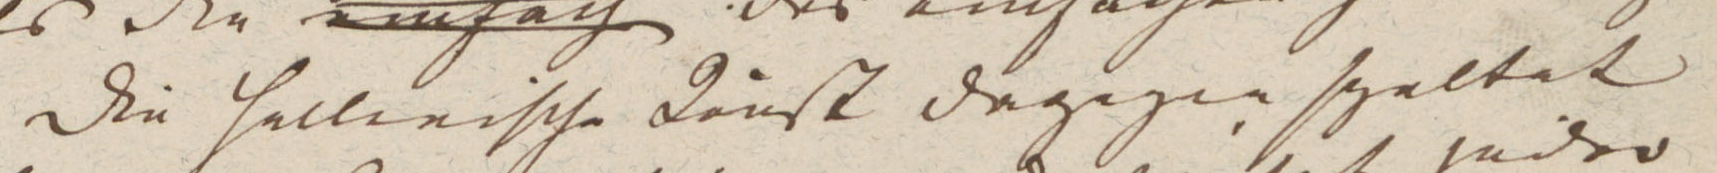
Die Hellenische Kunst dagegen spaltet
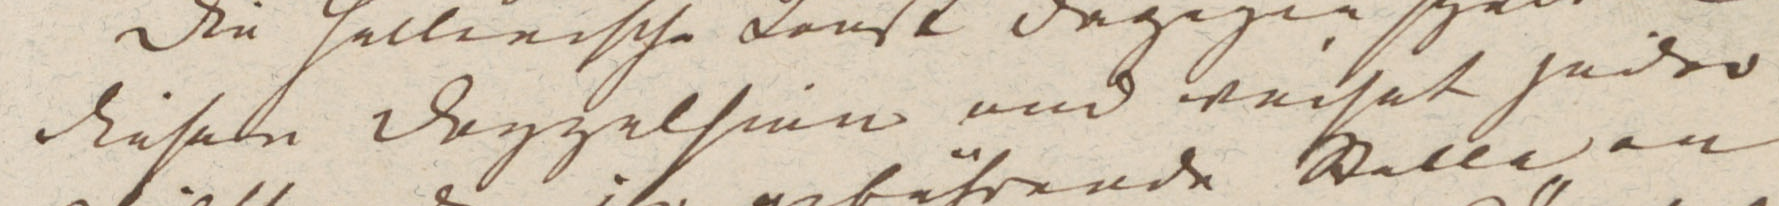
diesen Doppelsinn und weiset jeder
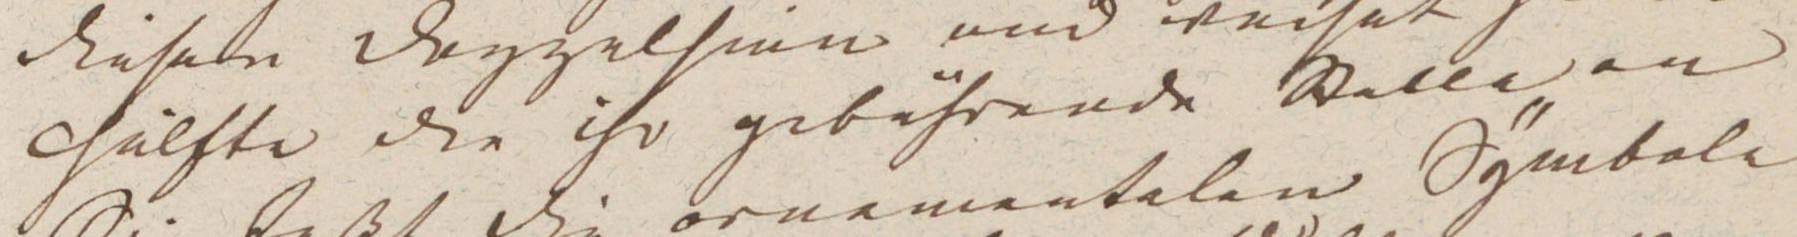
Hälfte die ihr gebührende Stelle an
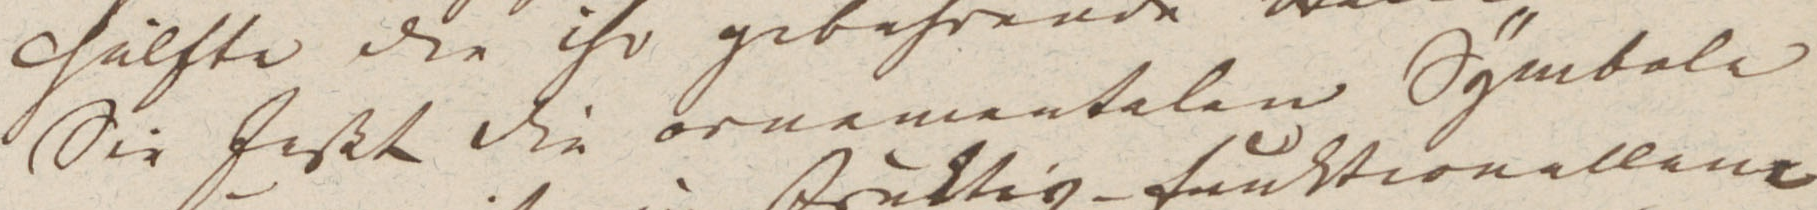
Sie fasst die ornamentalen Symbole
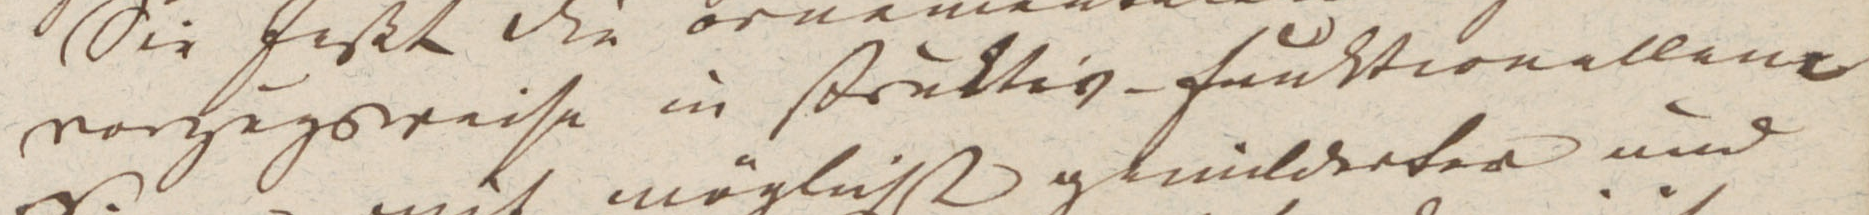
vorzugsweise in struktiv-funktionellenm
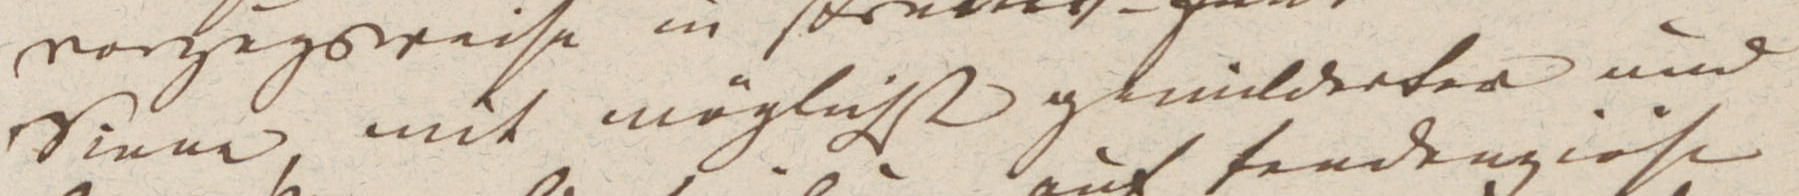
Sinne, mit möglichst gemilderter und
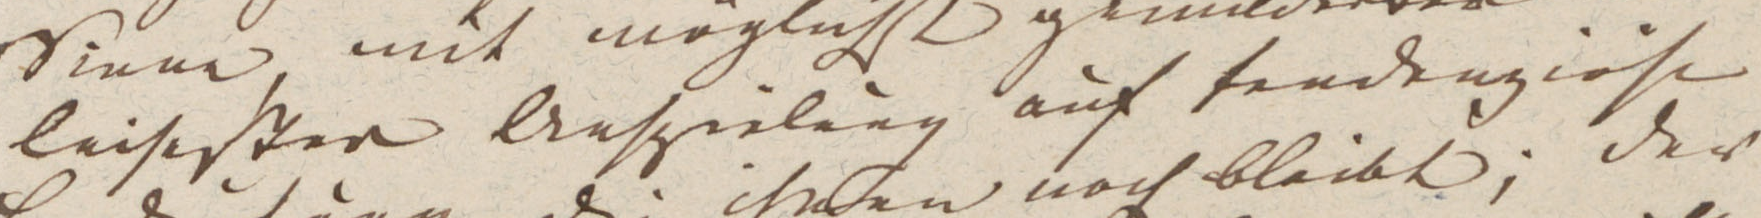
leisester Anspielung auf tendenziöse
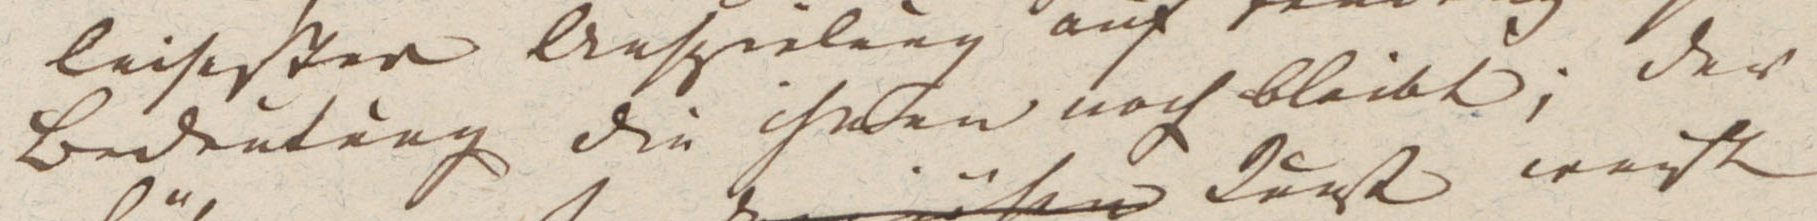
Bedeutung die ihnen noch bleibt; der
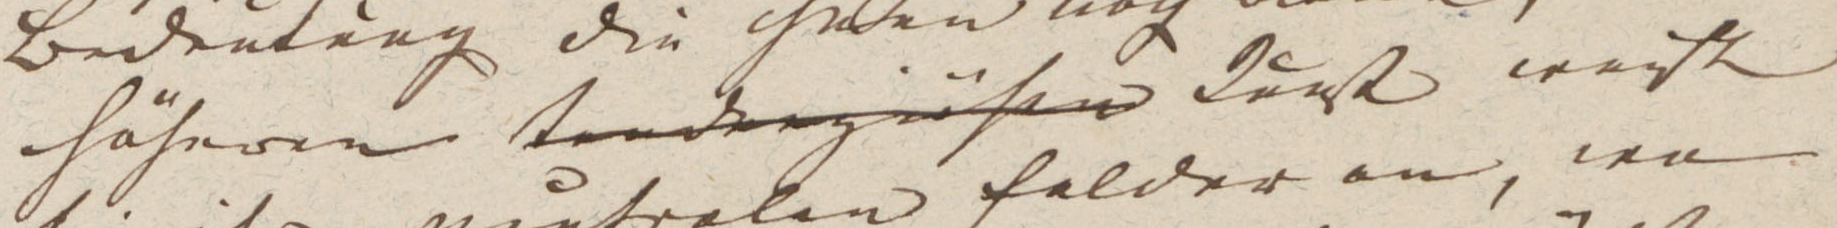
höheren tendenziösen Kunst weist
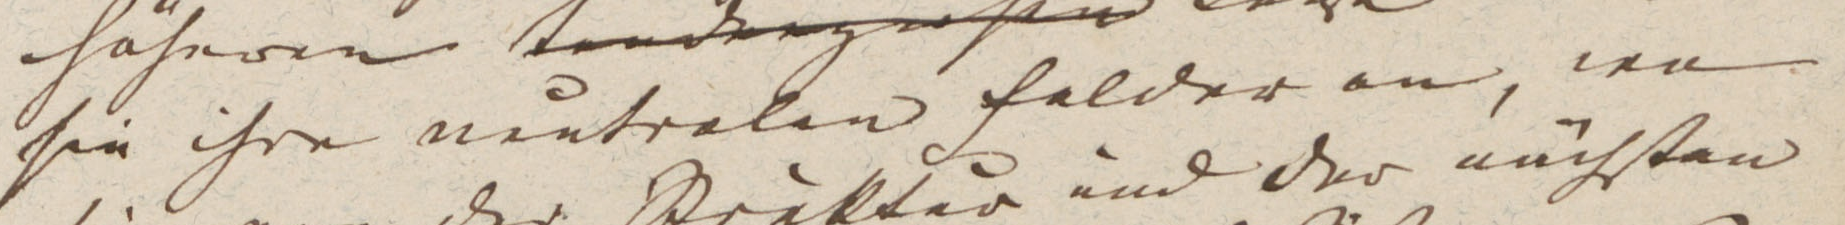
sie ihre neutralen Felder an, wo
